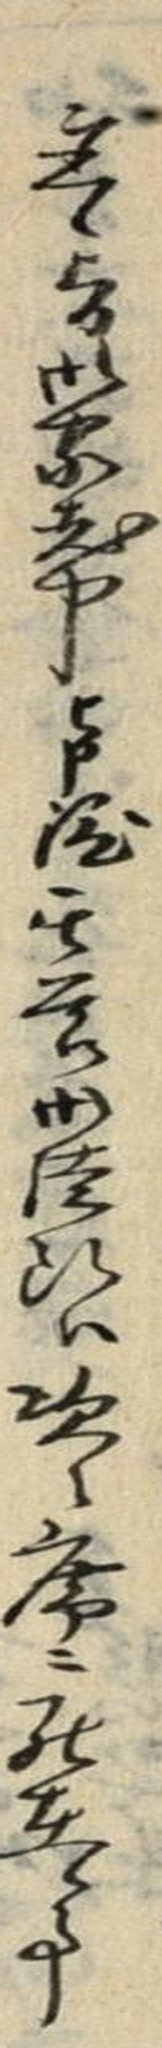置候旨御家老中被申渡其節御徒頭は次之席に罷在候事
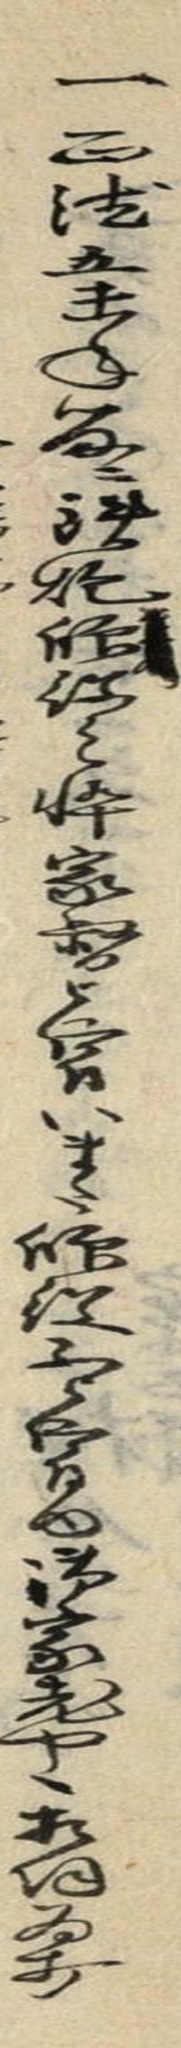一正徳五未年留に鉄炮師役之忰家督被仰付いまた師役不被仰付内御家老中へ相伺為打
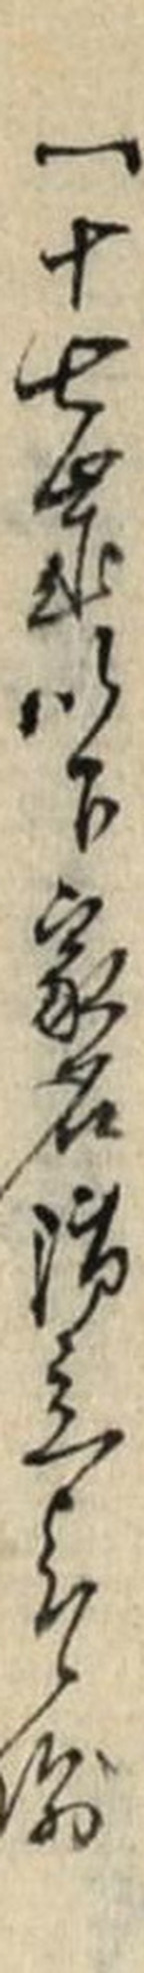一十七歳以下家名御立被下候例
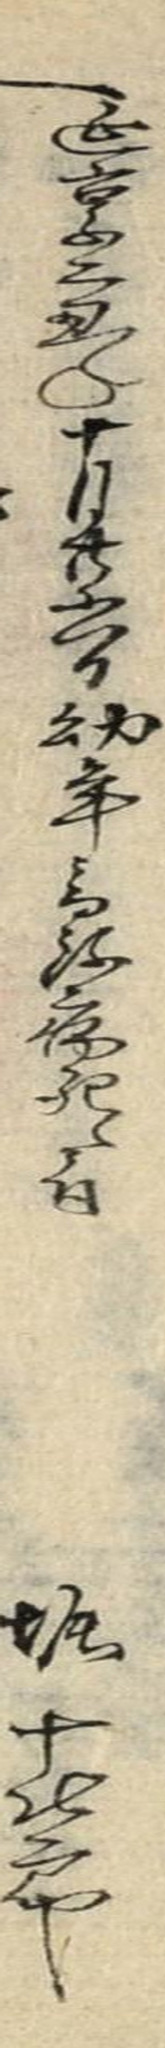延享二丑年十月廿六日幼年に而致病死候に付堀十次郎
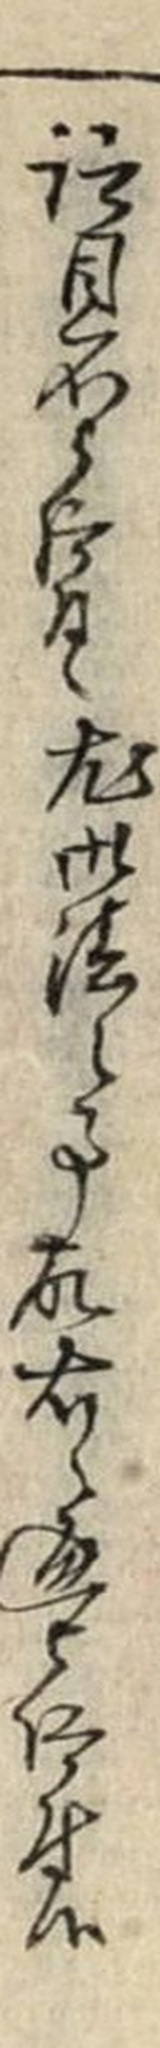跡目不被仰付候尤御法之事故右之通被仰付候
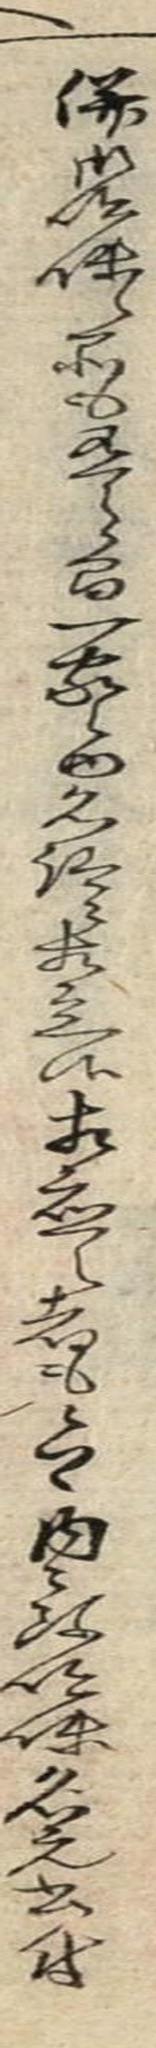併御吟味之品も有之候間一家之内名跡に相立候相応之者も候はゝ内々致吟味名元書付
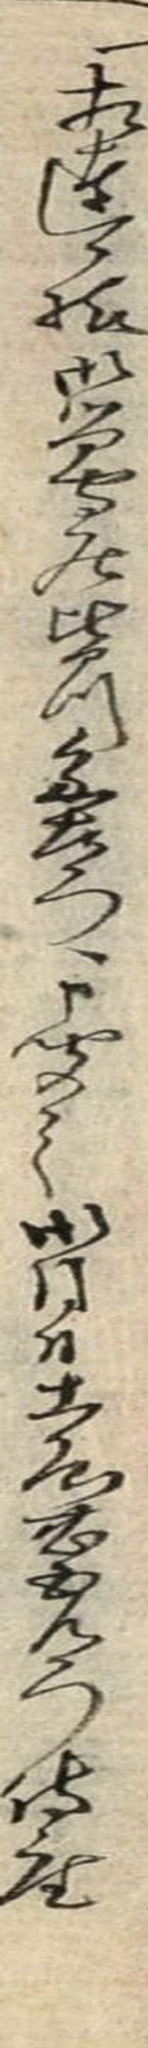相達候様御留守居皆川多左衛門へ申聞之御目付土屋甚五左衛門侍座
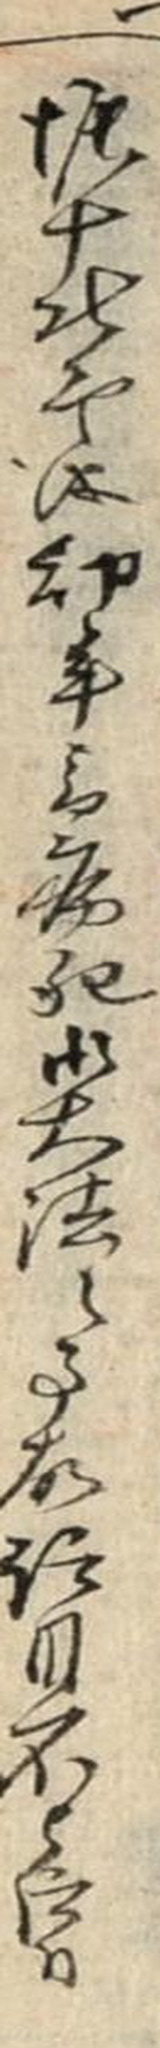堀十次郎儀幼年に而病死御大法之事故跡目不被仰付
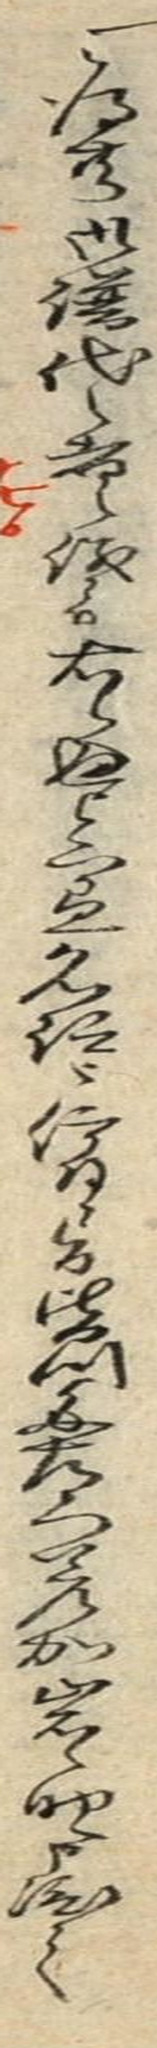候得共御譜代之者之儀に付右之通被下置名跡被仰付候旨皆川多左衛門差加岩之助へ申渡之
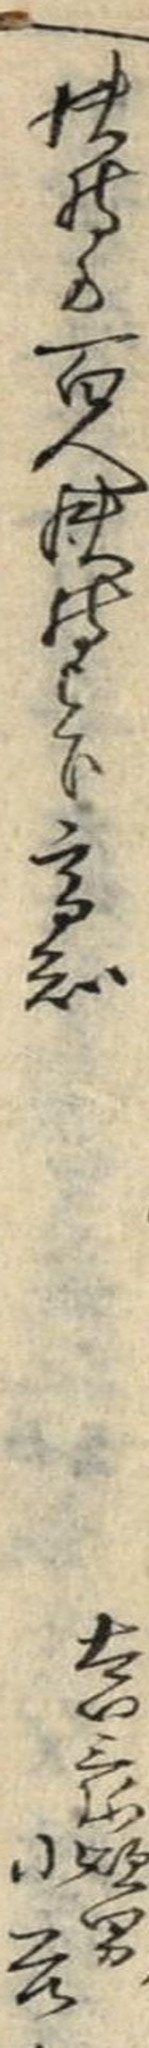扶持方百人扶持被下高知水谷鶴太郎八歳
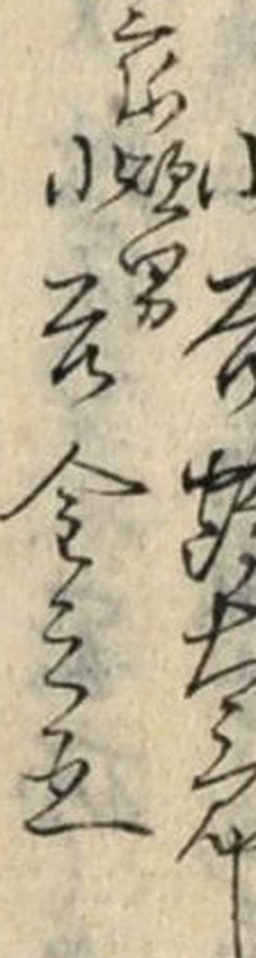水谷金之丞

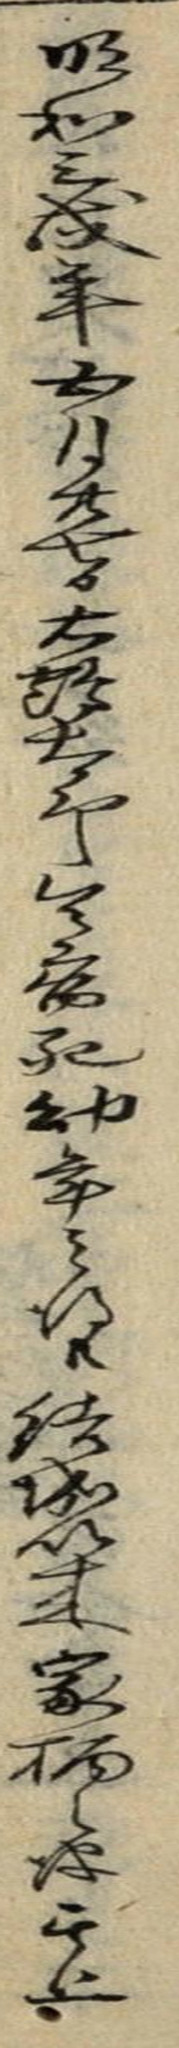明和三戌年五月廿七日右靏太郎今日病死幼年に候得共結城以来家柄之儀其上
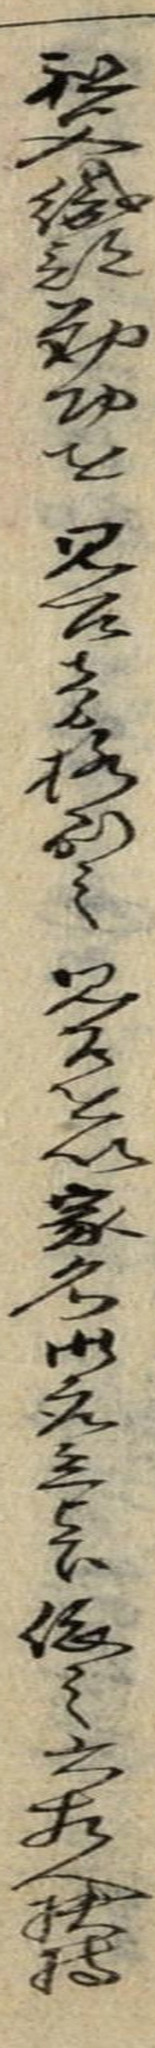祖父織部勤功を思召其方格別之思召を以家名御取立被下依之六拾人扶持
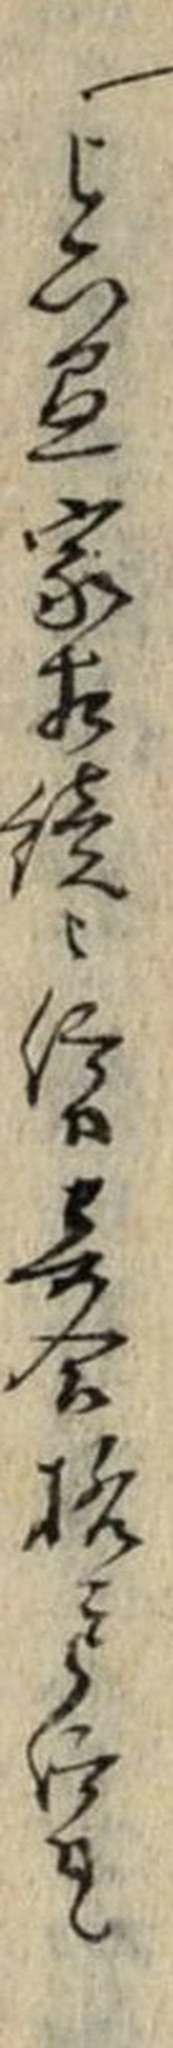被下置家相続に被仰付寄合格に被仰付候
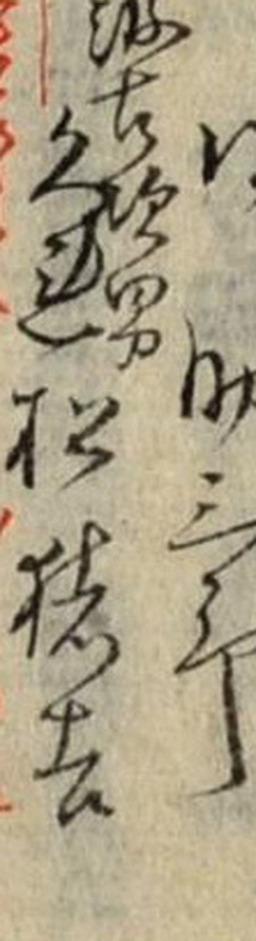久連松猪吉
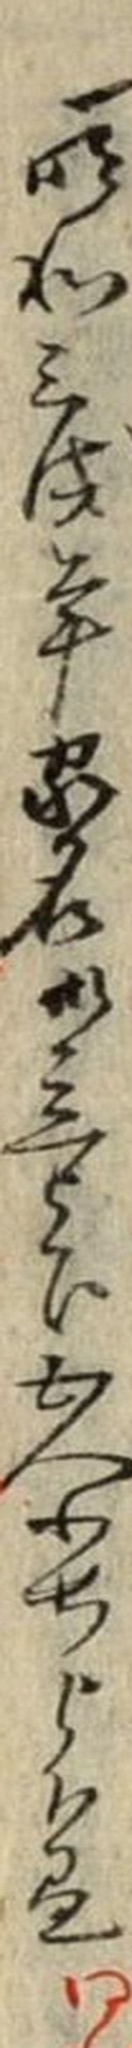明和五子年家名御立被下五人扶持被下置
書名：御用并被仰出之部
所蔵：福井県文書館 Fukui Prefectural Archives
